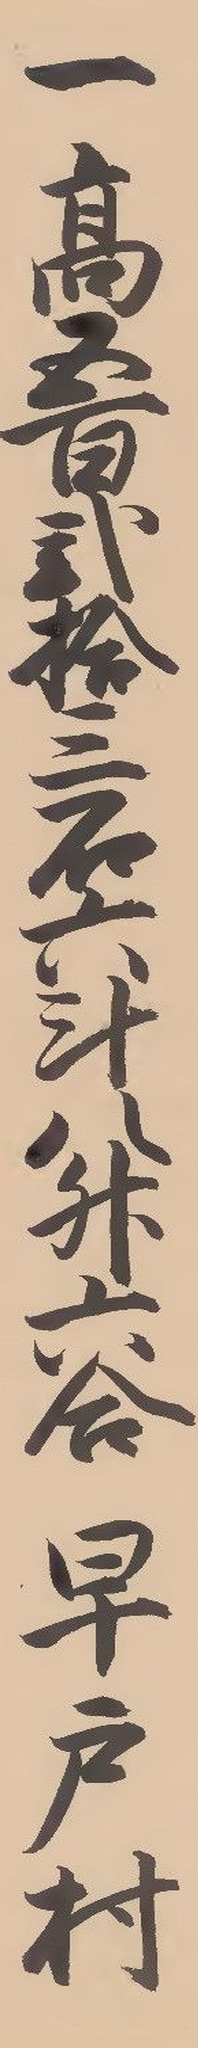一高五百弐拾三石六斗八升六合早戸村
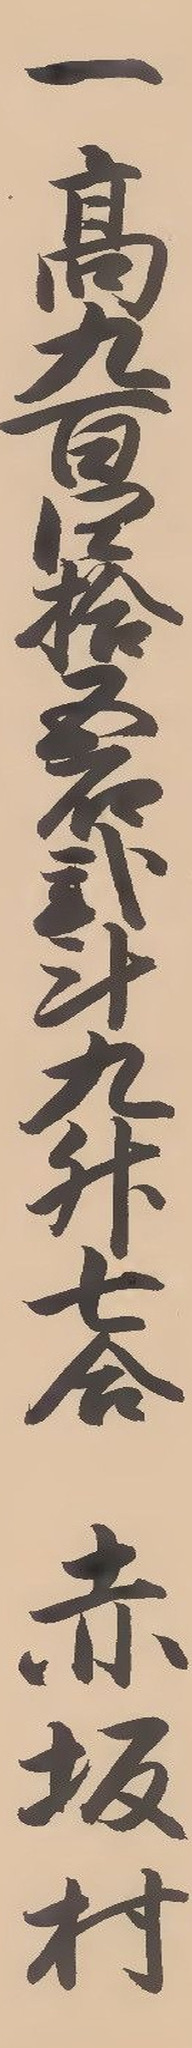一高九百四拾五石弐斗九升七合赤坂村
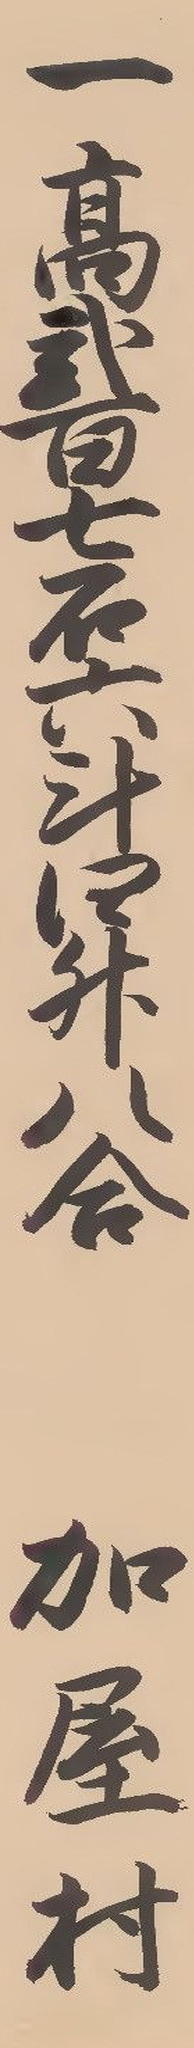一高弐百七石六斗四升八合加屋村
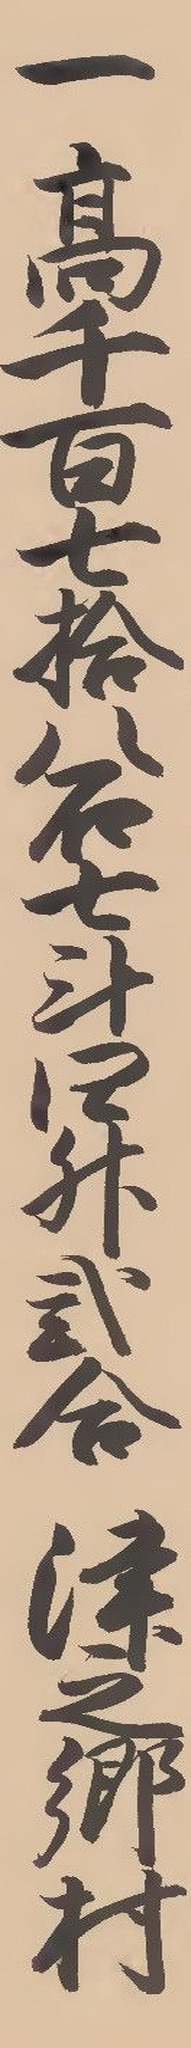一高千百七拾八石七斗四升弐合津之郷村
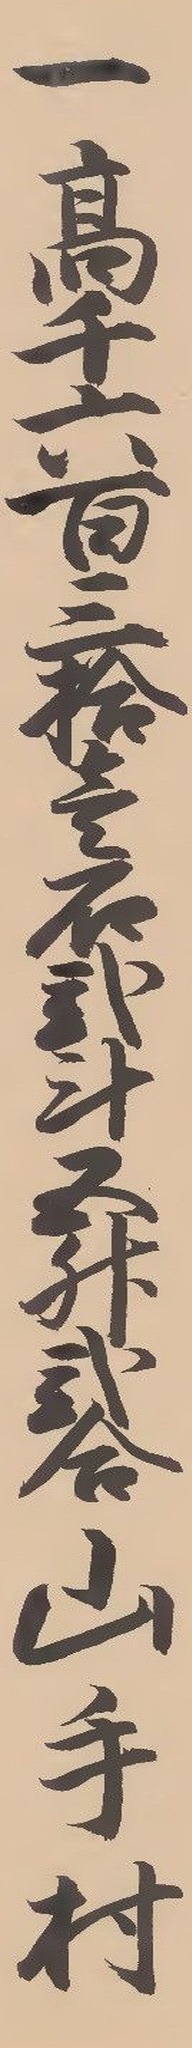一高千六百三拾壱石弐斗五升弐合山手村
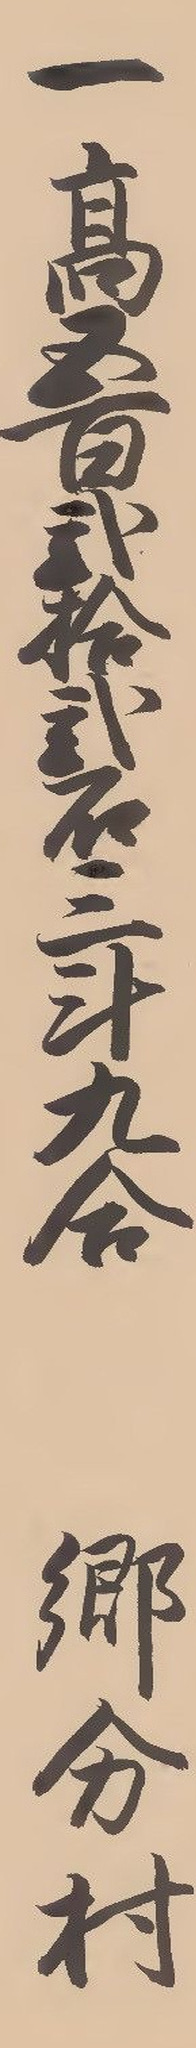一高五百弐拾弐石三斗九合郷分村
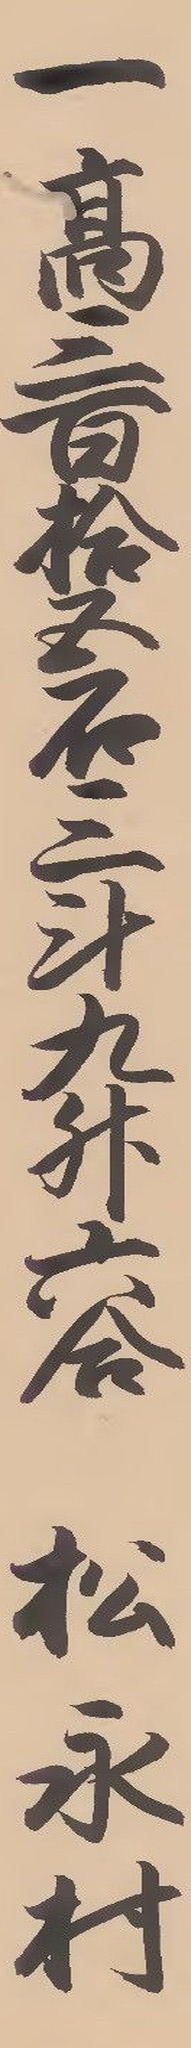一高三百拾五石三斗九升六合松永村

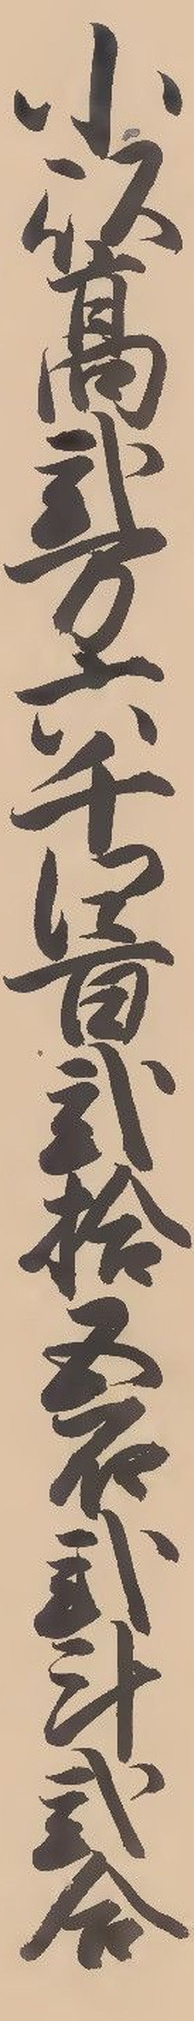小以高弐万六千四百弐拾五石弐斗弐合
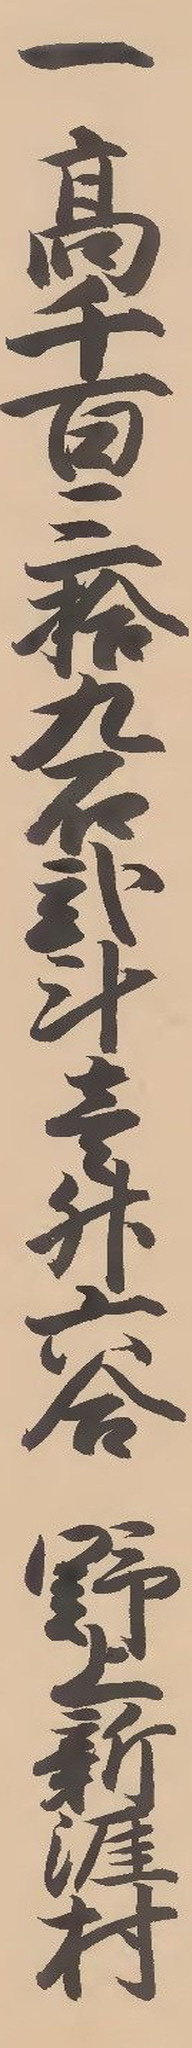一高千百三拾九石弐斗壱升六合野上新涯村
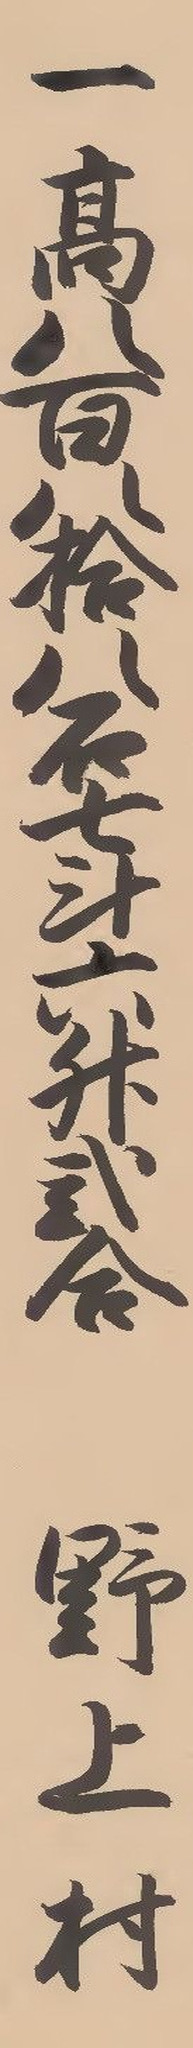一高八百八拾八石七斗六升弐合野上村
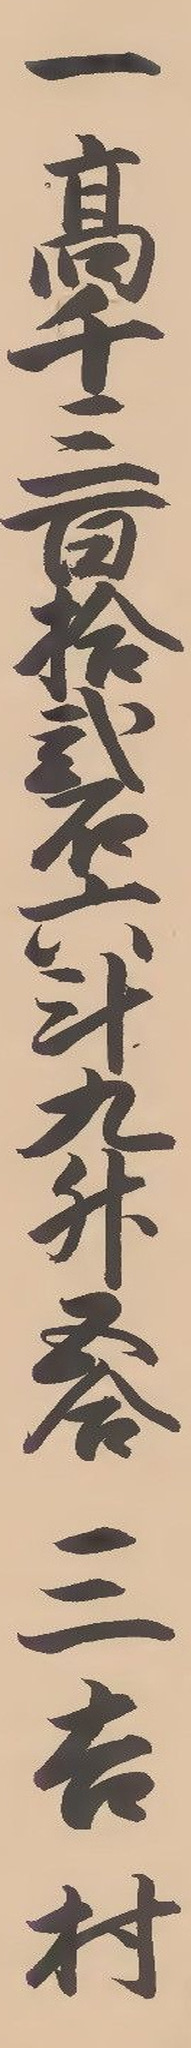一高千三百拾弐石六斗九升五合三吉村

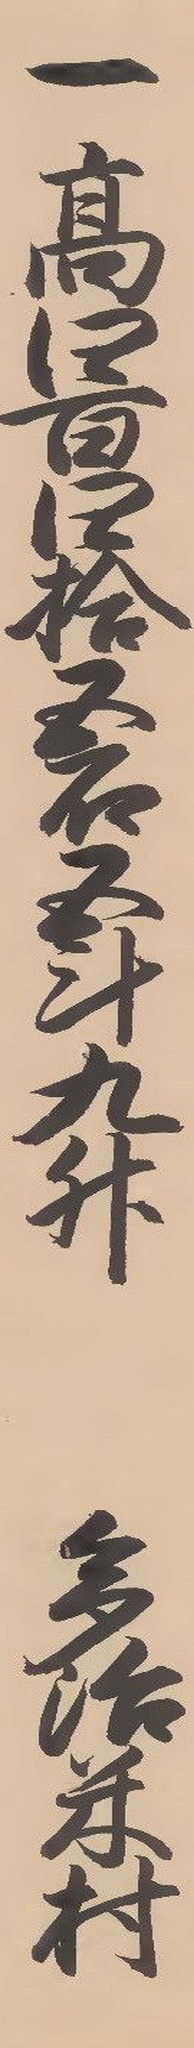一高四百四拾五石五斗九升多治米村
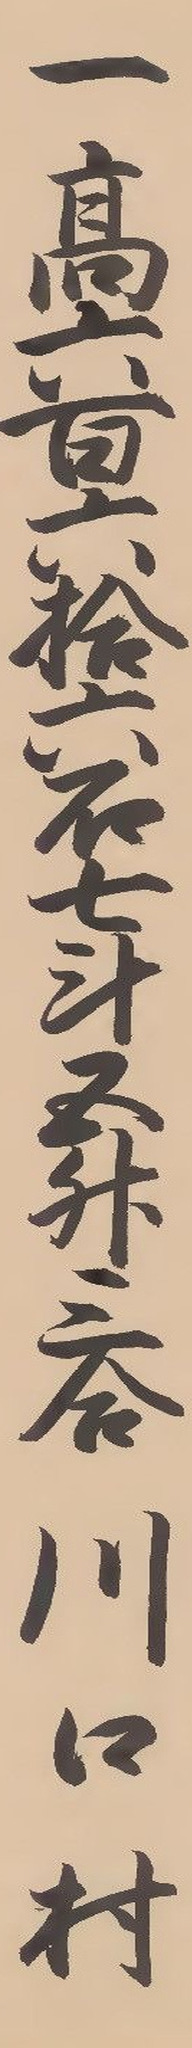一高六百六拾六石七斗五升三合川口村
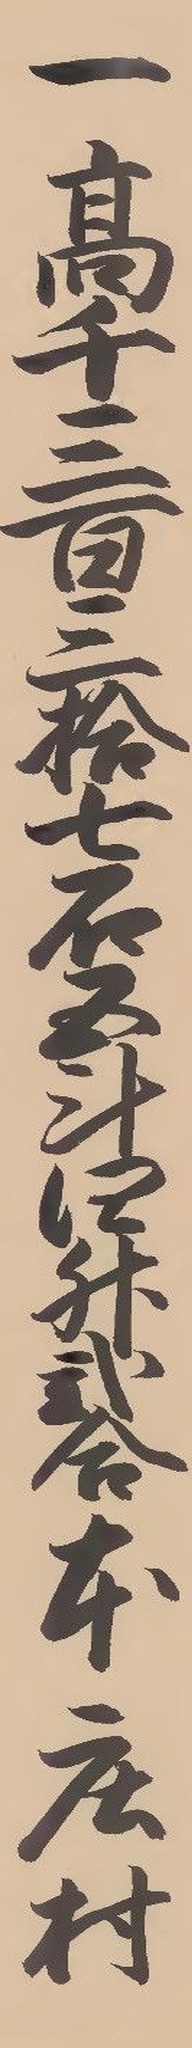一高千三百三拾七石五斗四升弐合本庄村
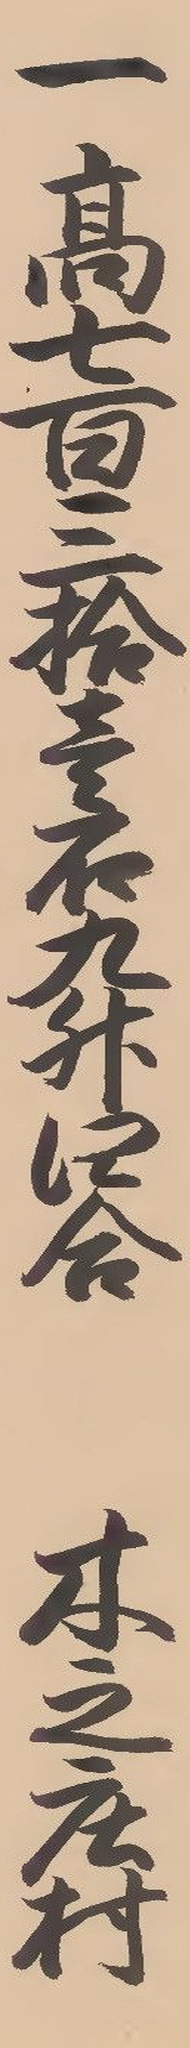一高七百三拾壱石九升四合木之庄村
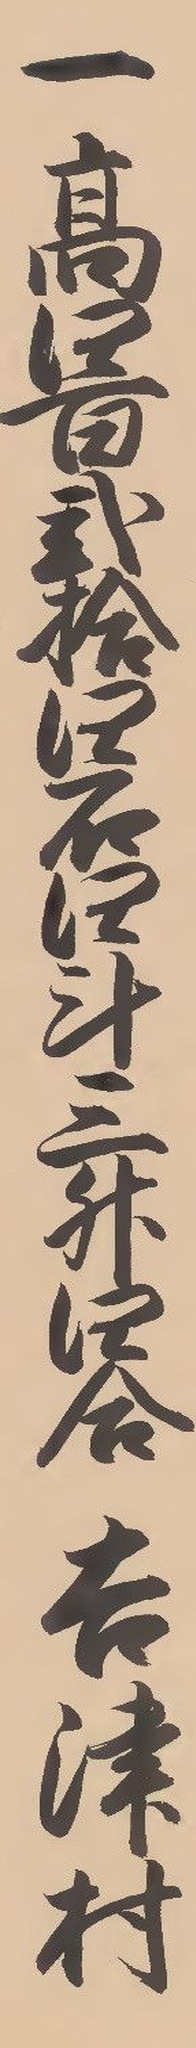一高四百弐拾四石四斗三升四合吉津村
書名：備後国郷帳
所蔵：国立公文書館 National Archives of Japan
